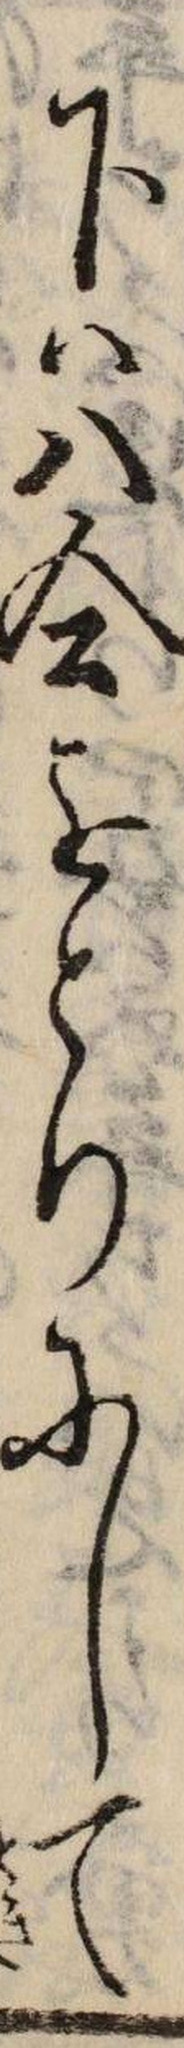下は八合をとりにして
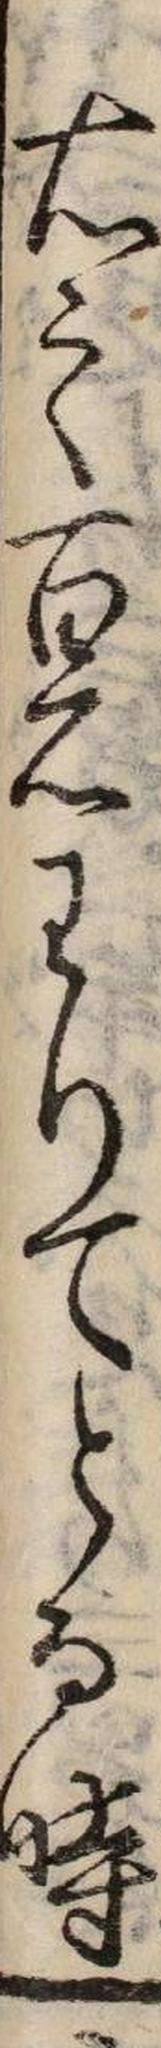右之百石わりてとる時
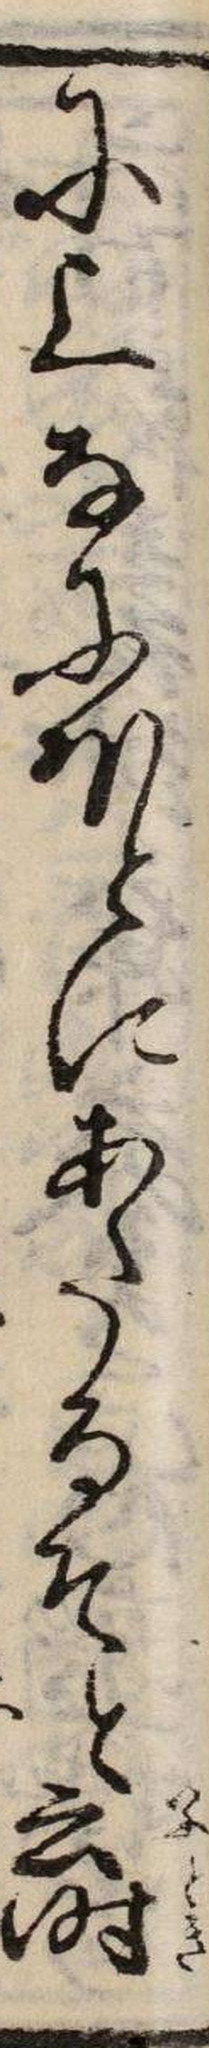に上なにほとにあたるそと云時
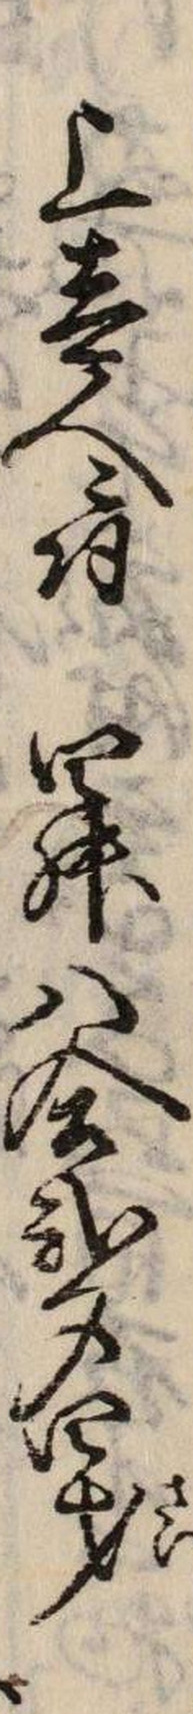上壱人に付四升八合弐勺四才
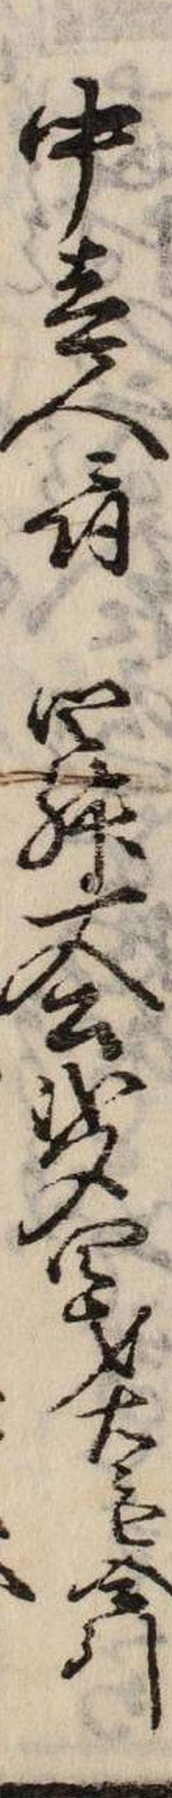中壱人に付四升一合弐勺四才合引
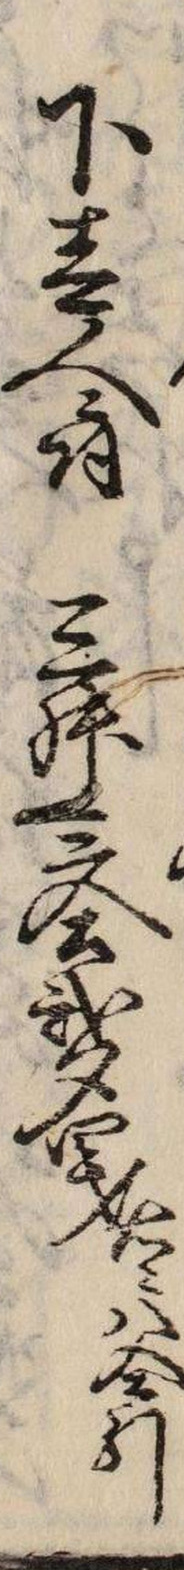下壱人ニ付三升三合弐勺四才八合引
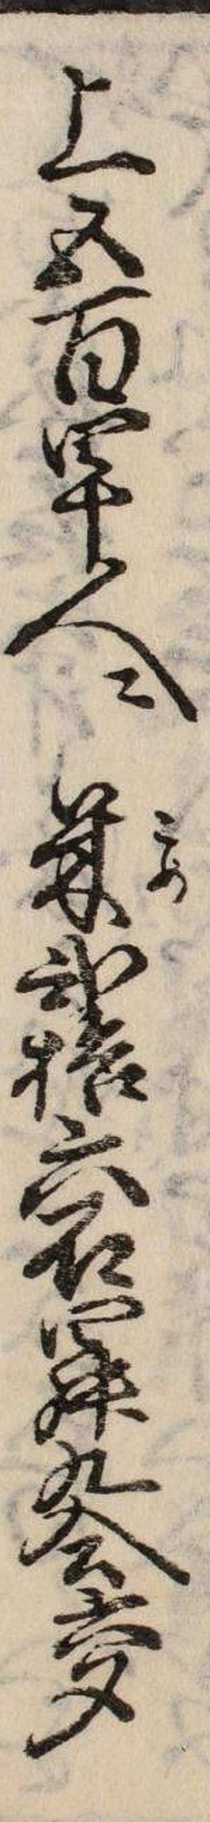上五百四十人に米弐拾六石四升九合六勺
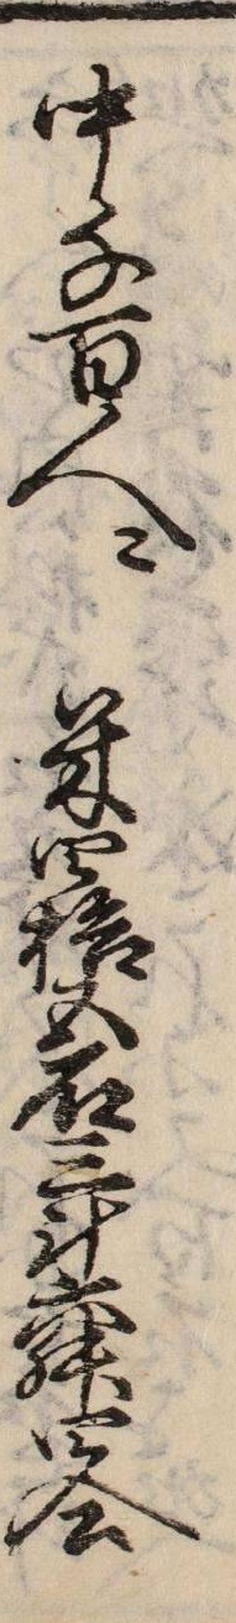中千百人に米四拾五石三斗六升四合
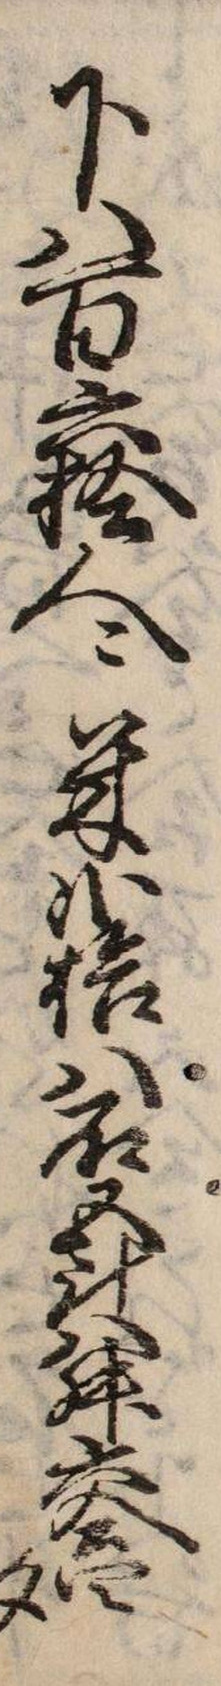下八百六拾人に米弐拾八石五斗八升六合四勺

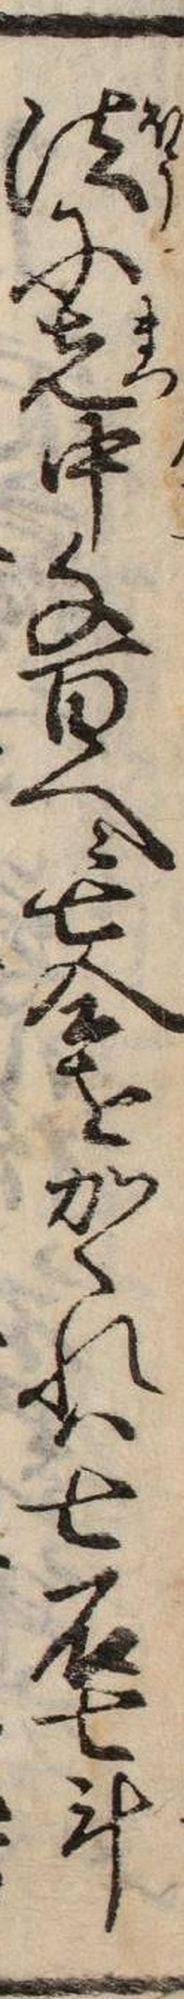法に先中千百人に七合をかくれは七石七斗
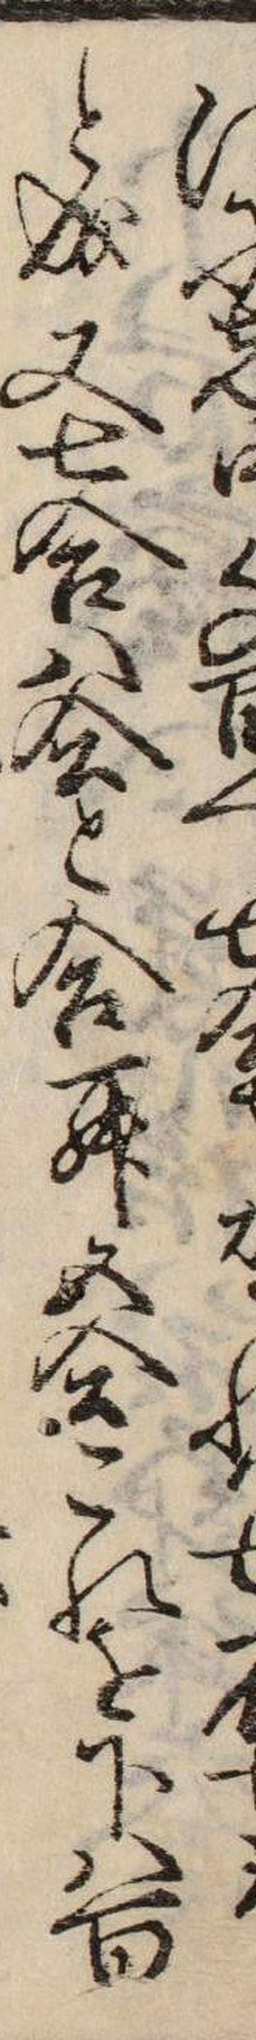と成又七合八合と合一升五合これを下八百
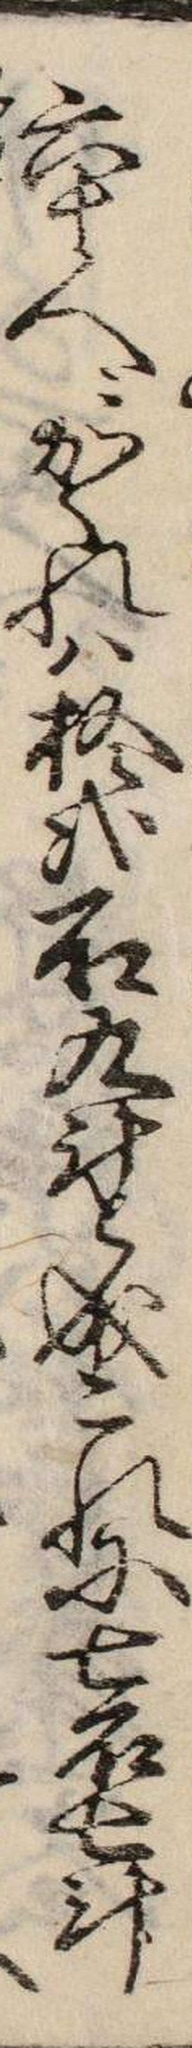六十人にかくれは拾弐石九斗と成これに七斗七斗
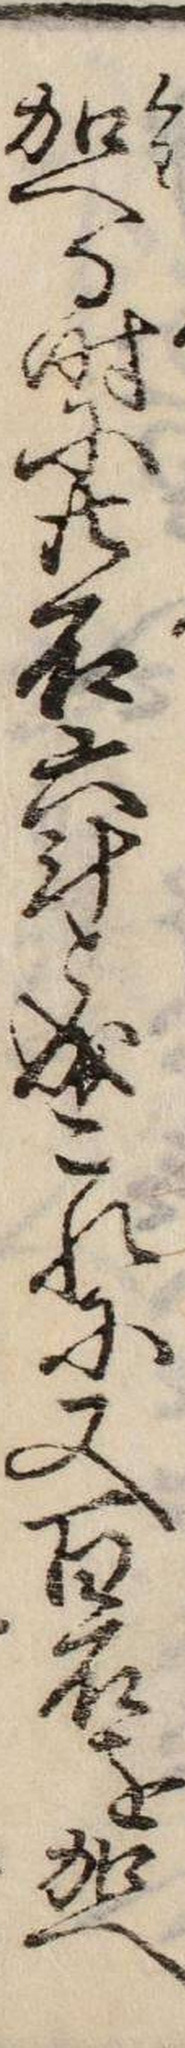加へる時に廿石六斗と成これに又百石を加へ
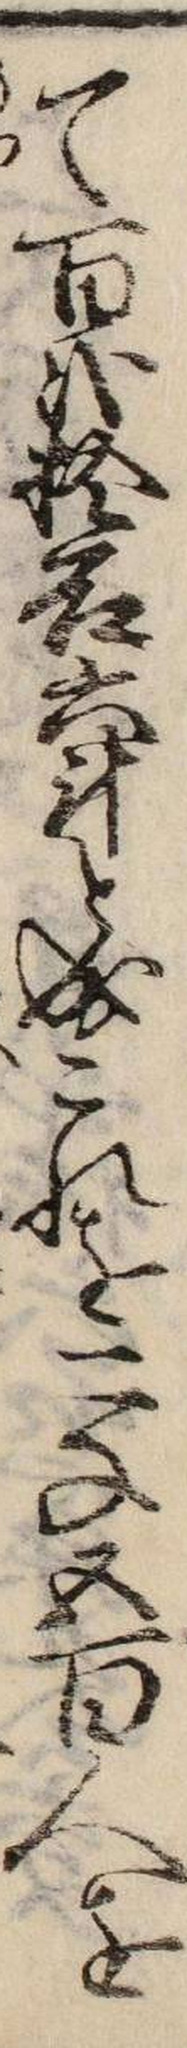て百弐拾石六斗と成これを二千五百人を
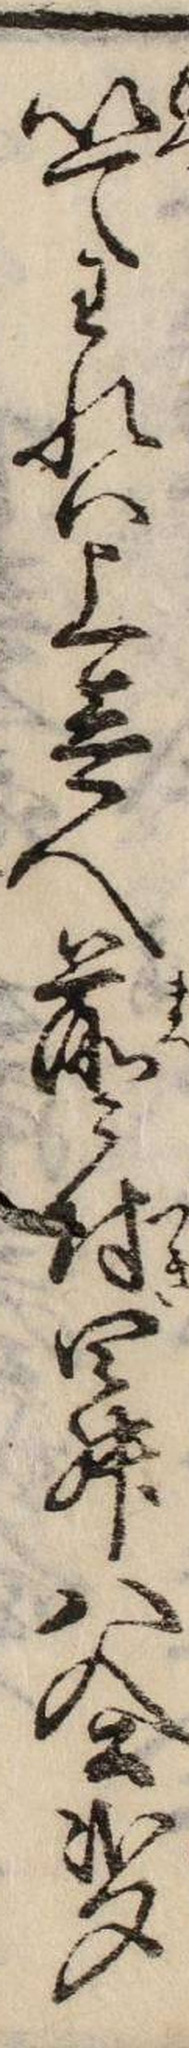以てわれは上壱人前に付四升八合弐勺
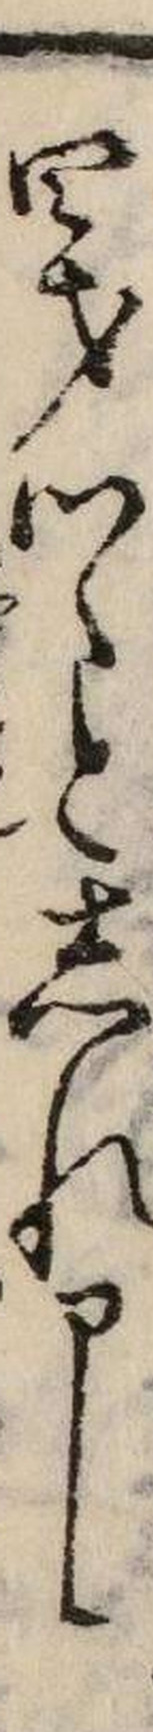四才つつとしれ申候
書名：塵劫記（寛永11年自跋、京都府立京都学・歴彩館追貴8）
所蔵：京都府立京都学・歴彩館 国文学研究資料館
